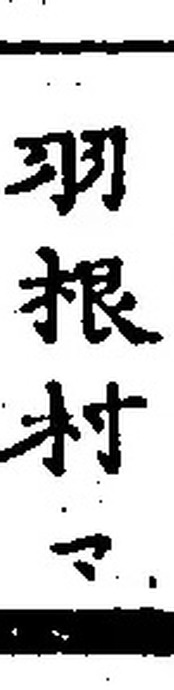羽根村マ

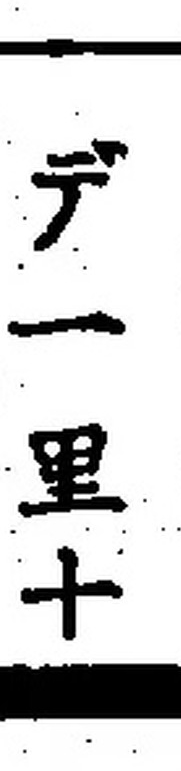デ一里十
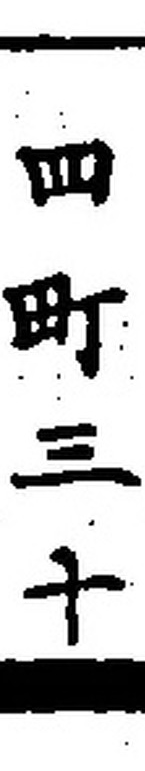四町三十
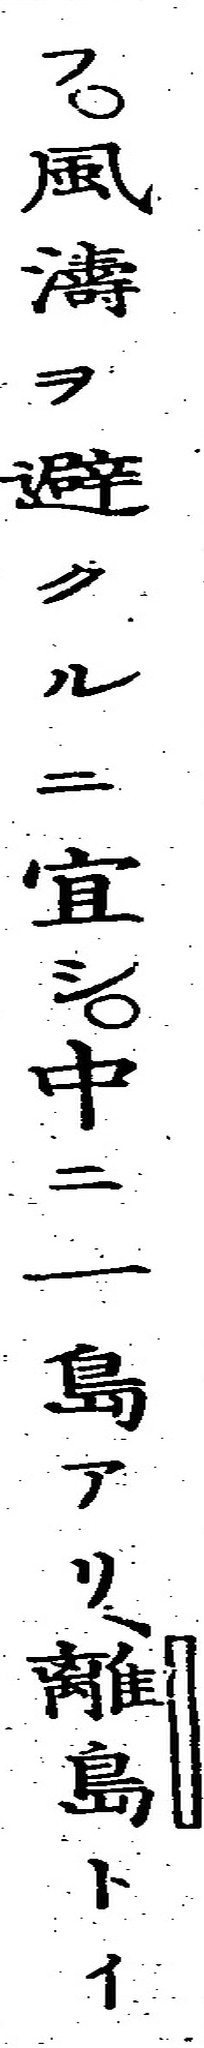フ。風濤ヲ避クルニ宜シ。中ニ一島アリ、離島トイ
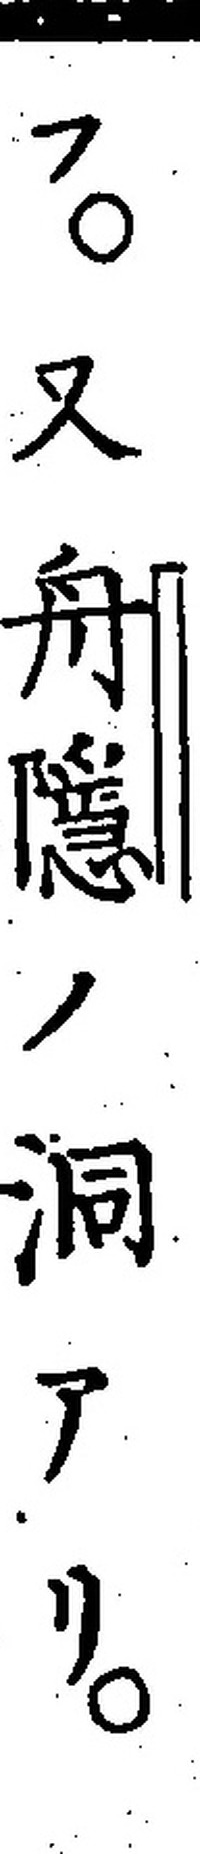フ。又舟隠ノ洞アリ。
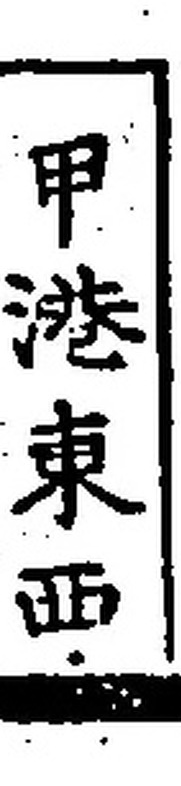甲港東西
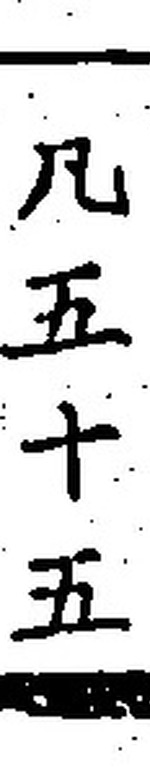凡五十五
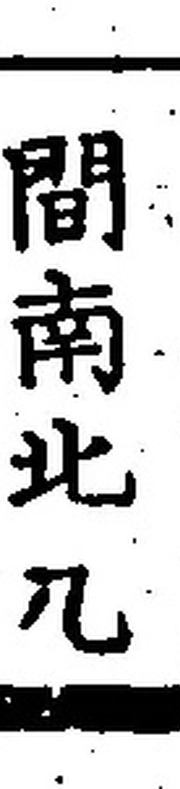間南北几
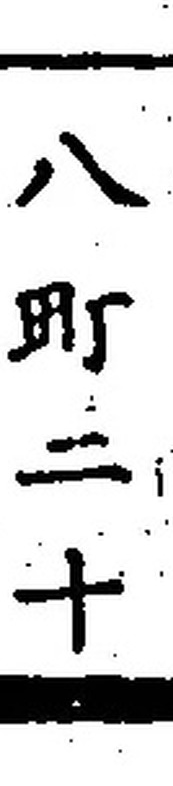八町二十
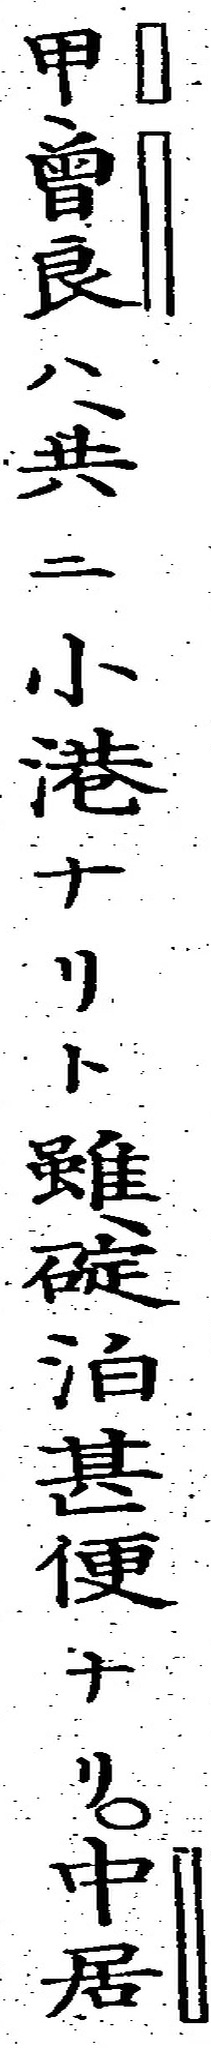甲・曽良ハ、共ニ小港ナリト雖、碇泊甚便ナリ。中居
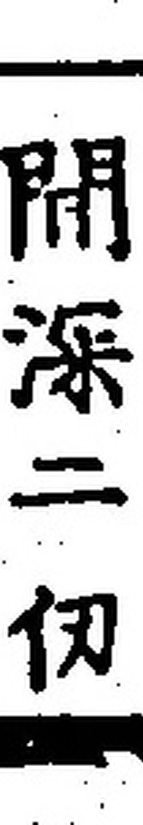間深二仞
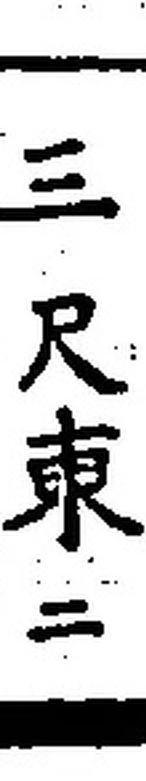三尺東ニ
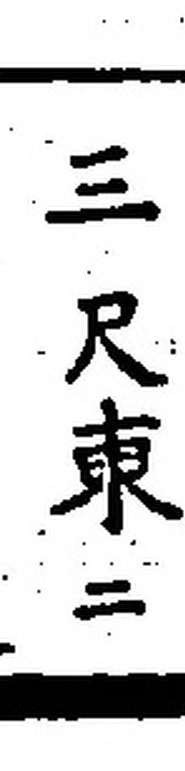三尺東ニ
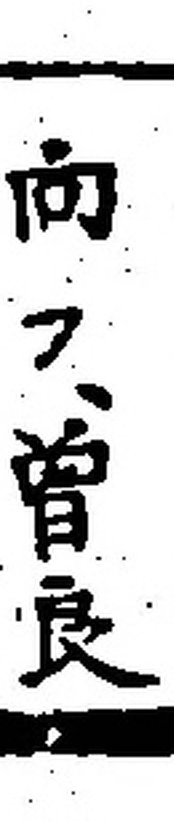向フ、曽良
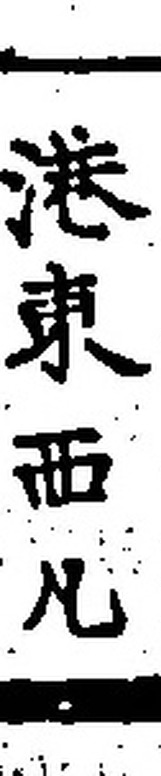港東西凡
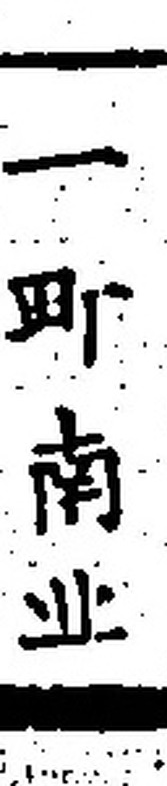一町南北
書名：能登地誌略
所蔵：国立国会図書館 National Diet Library, JAPAN
